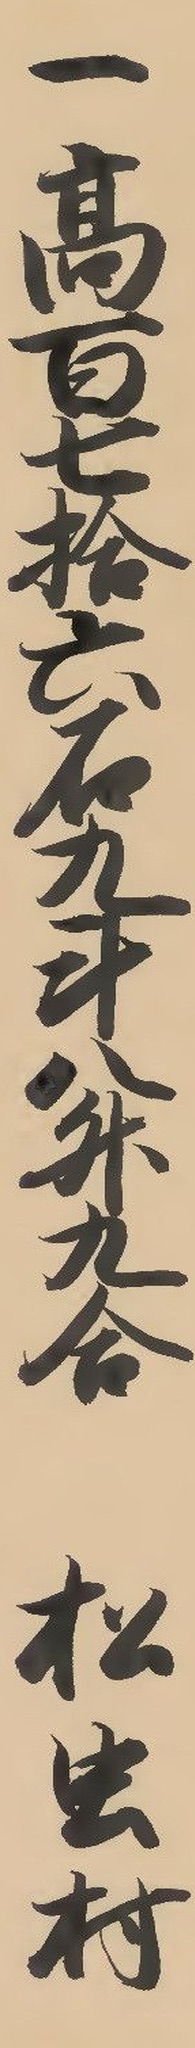一高百七拾六石九斗八升九合松虫村
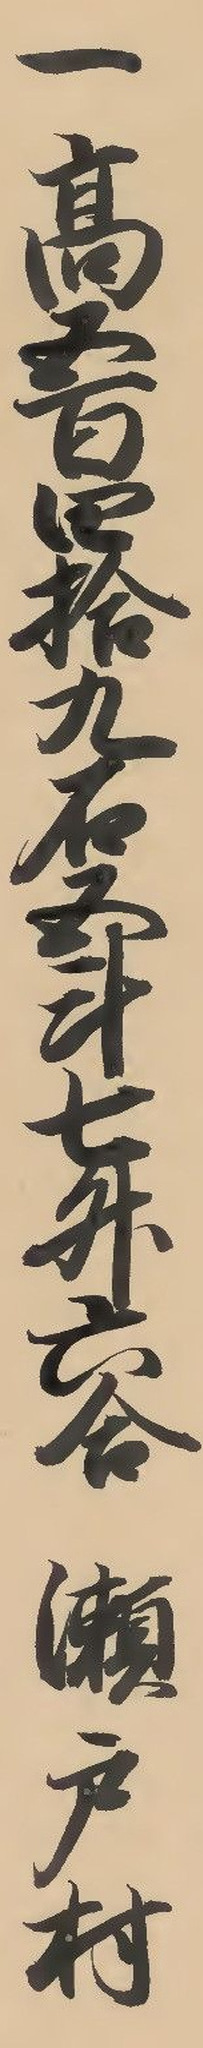一高五百四拾九石五斗七升六合瀬戸村
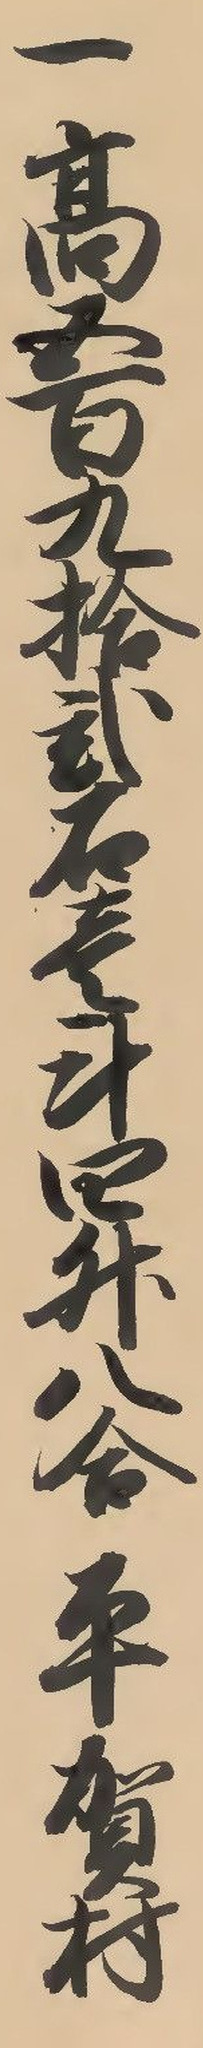一高五百九拾弐石壱斗四升八合平賀村
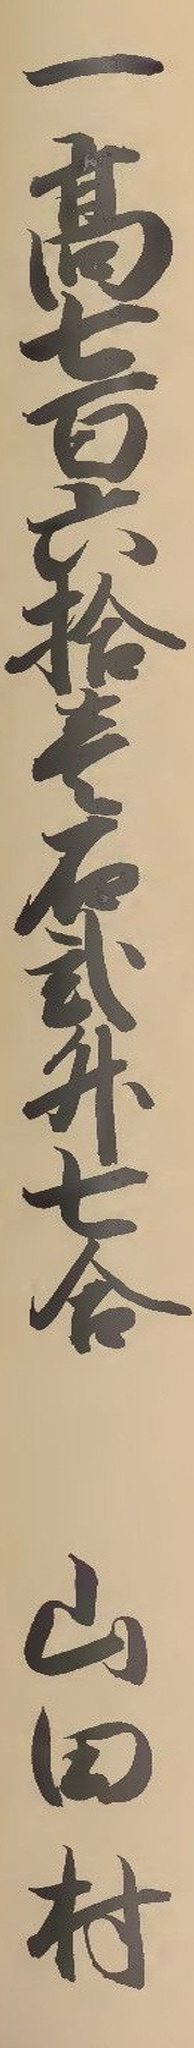一高七百六拾壱石弐升七合山田村
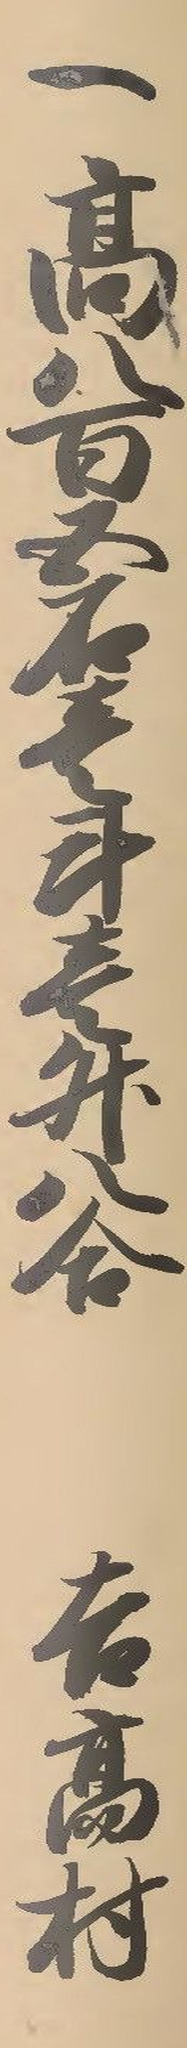一高八百五石壱斗壱升八合吉高村
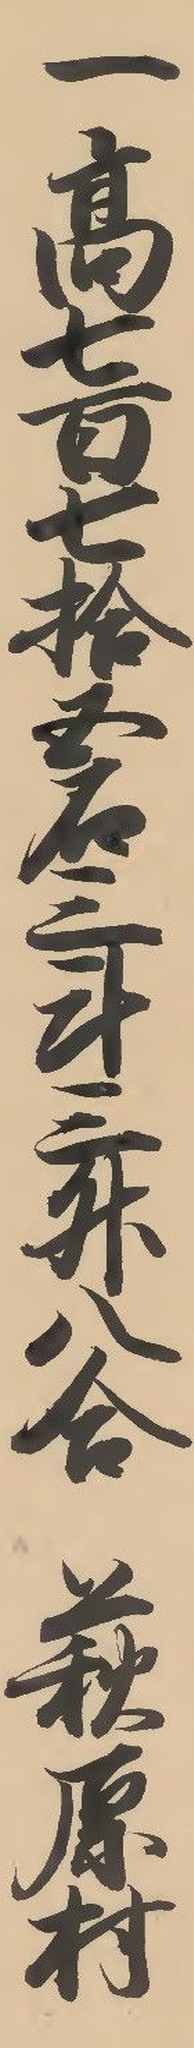一高七百七拾五石三斗三升八合萩原村
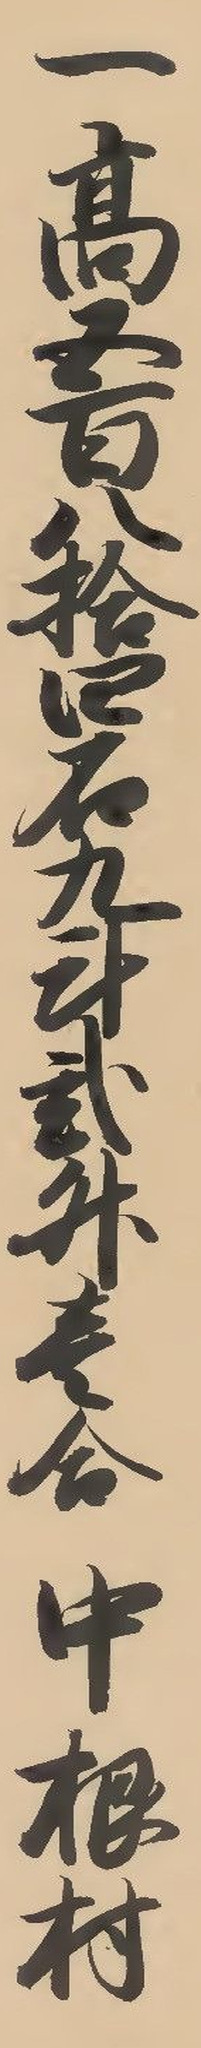一高五百八拾四石九斗弐升壱合中根村
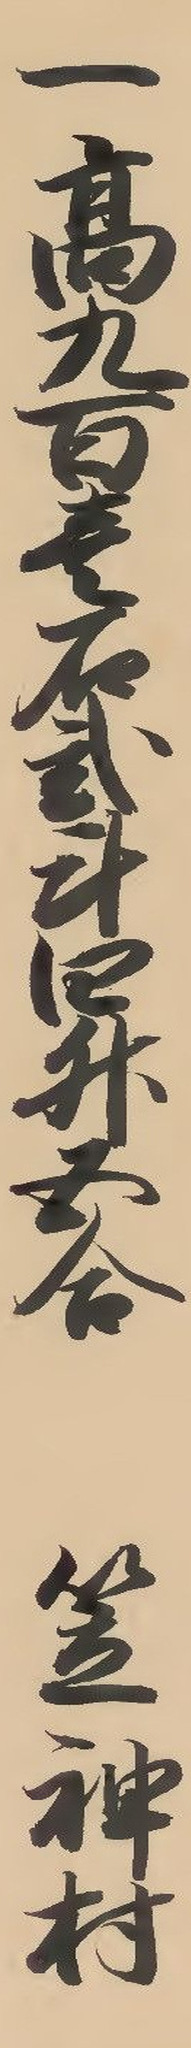一高九百壱石弐斗四升五合笠神村

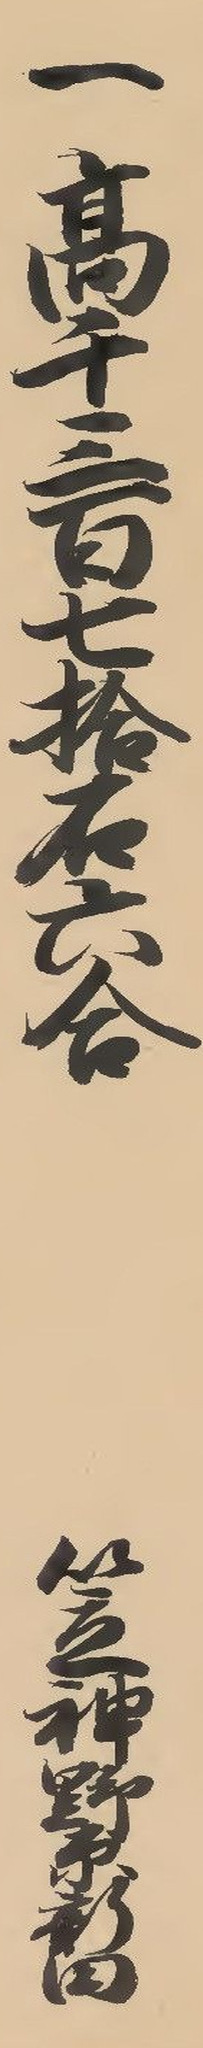一高千三百七拾石六合笠神野原新田
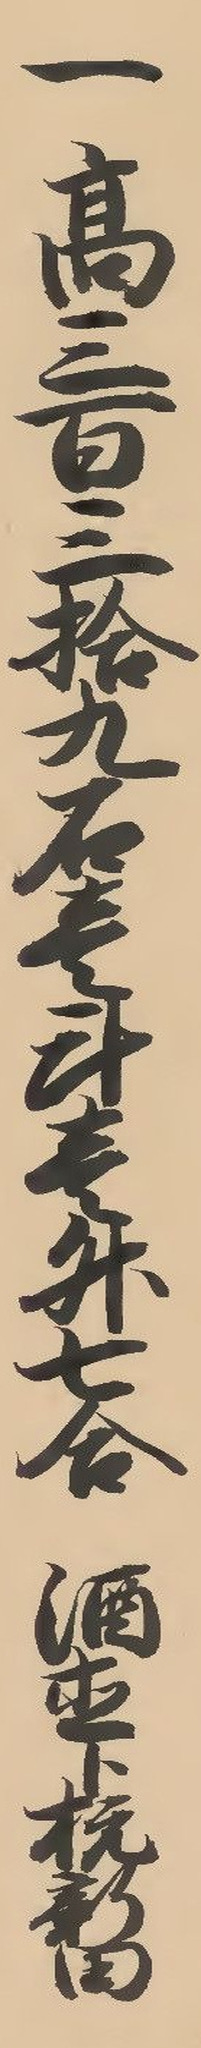一高三百三拾九石壱斗壱升七合酒直卜杭新田
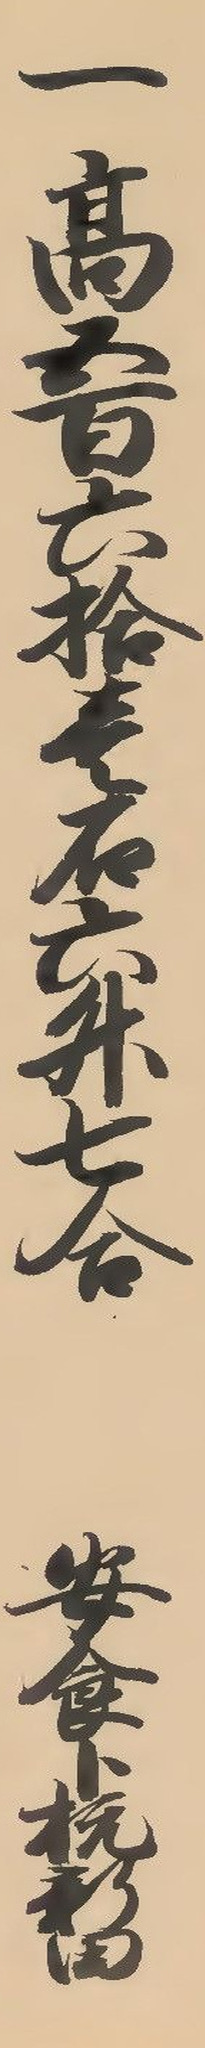一高五百六拾壱石六升七合安食ト杭新田

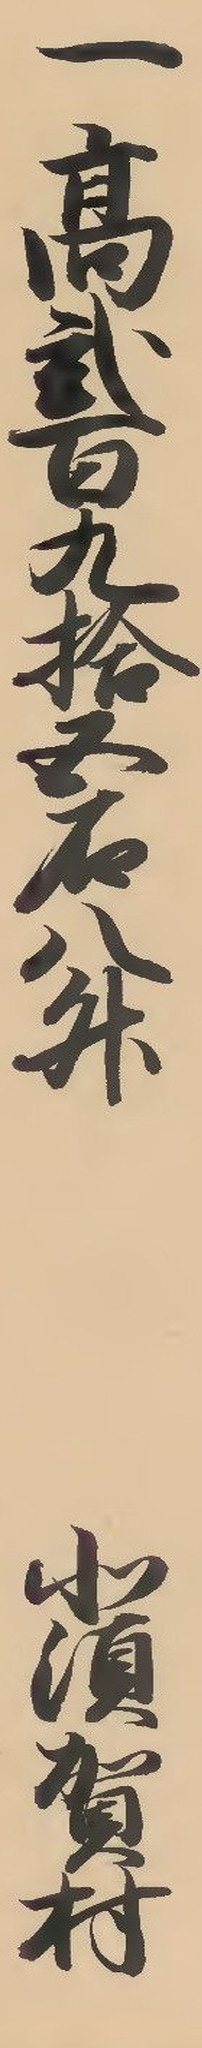一高弐百九拾五石八升北須賀村

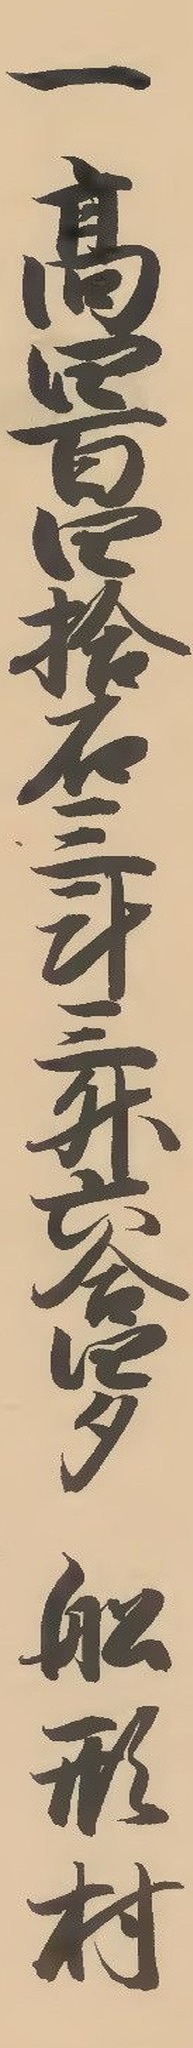一高四百四拾石三斗三升六合四勺船形村
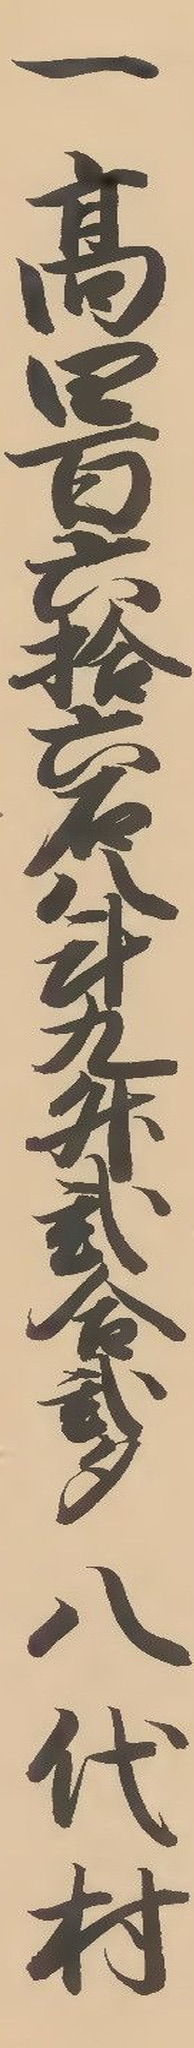一高四百六拾六石八斗九升弐合弐勺八代村
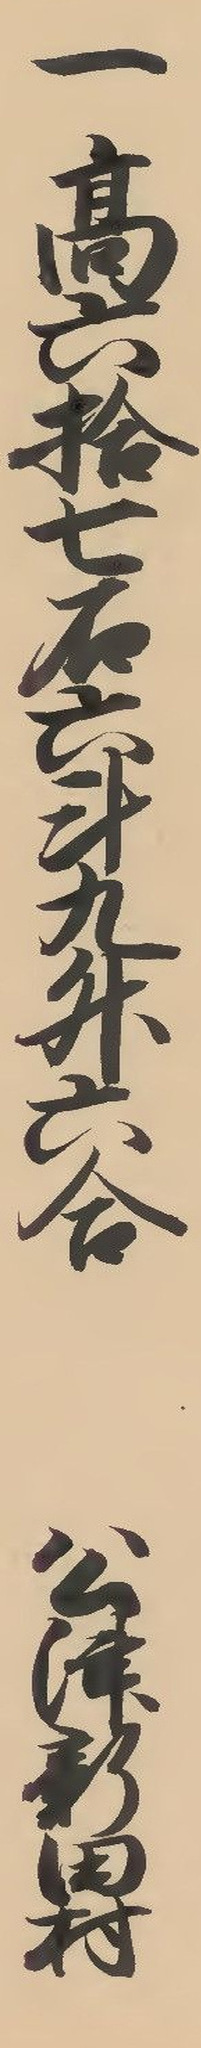一高六拾七石六斗九升六合公津新田村

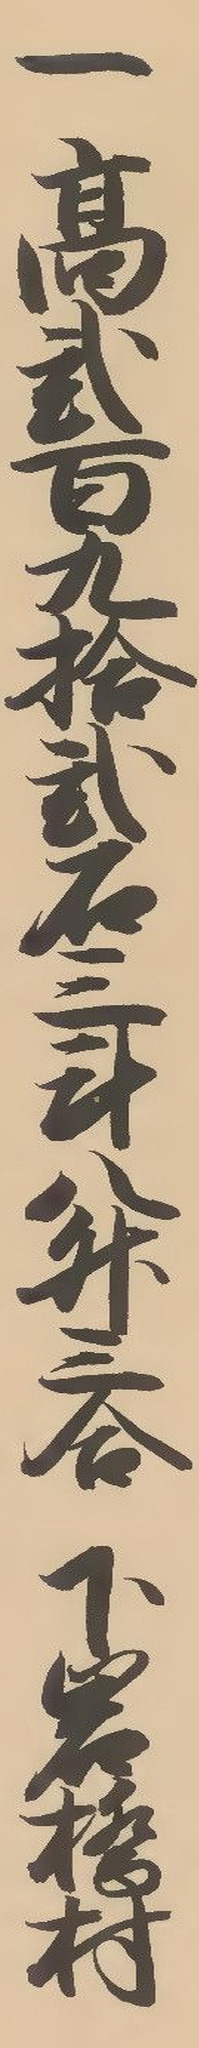一高弐百九拾弐石三斗八升三合下岩橋村
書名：下総国郷帳
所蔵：国立公文書館 National Archives of Japan
